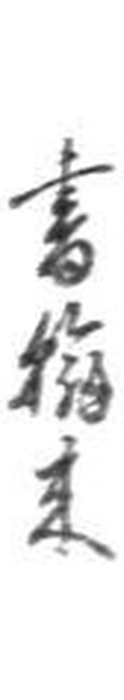書翰来
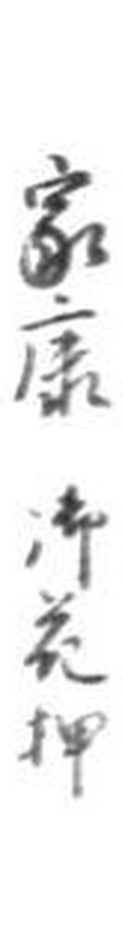家康御花押
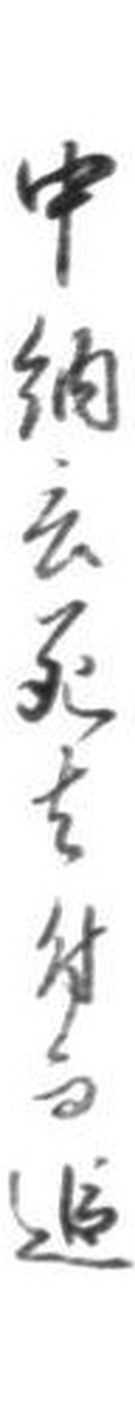中納言死去付而追
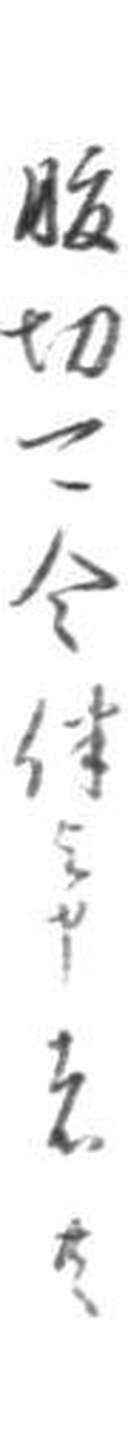腹切可令伴と申者共

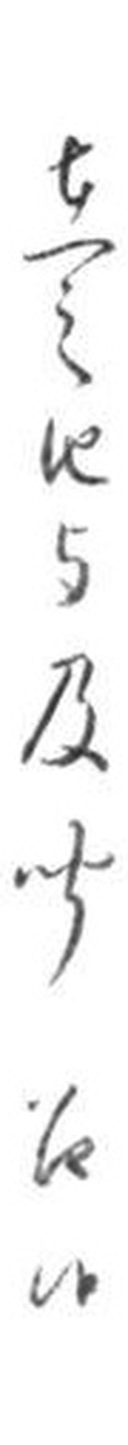在之由と及聞召候
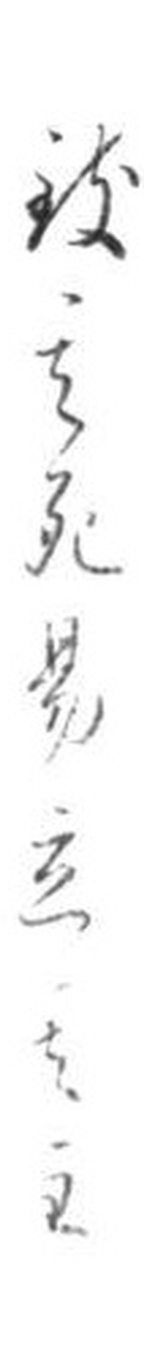致其死易立其主
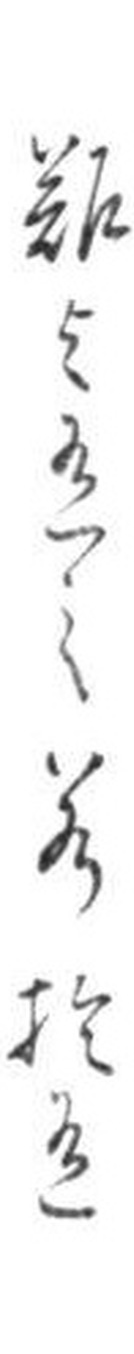難と有之若於有
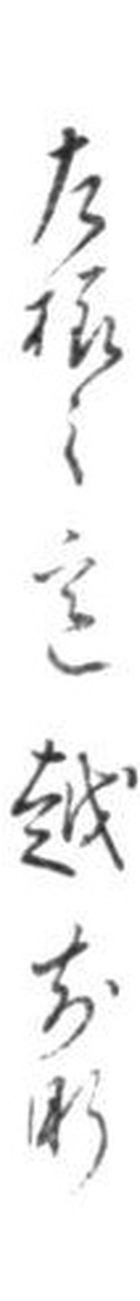左様之意越前肝
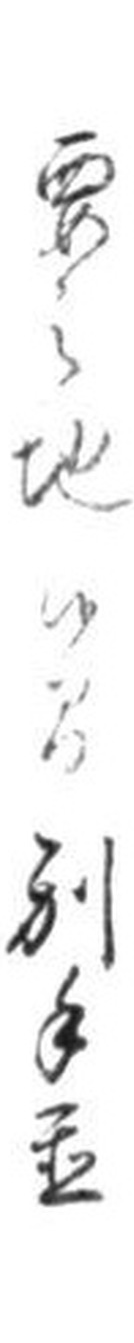要之地候間別手置
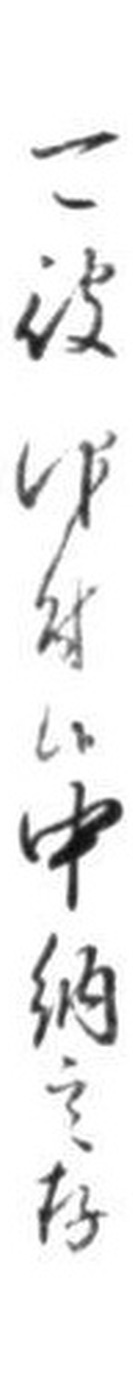可被仰付候中納言存
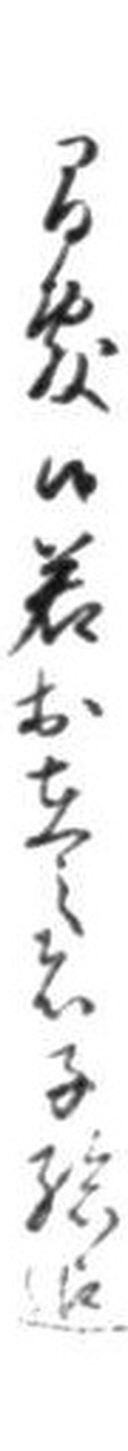間敷候若於在之者子孫迄
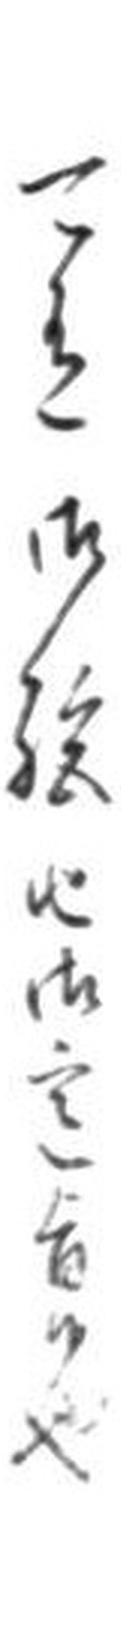可有御絶由御意旨候也
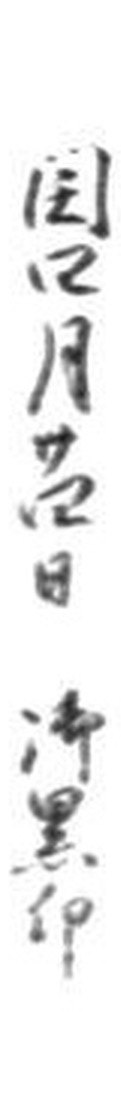閏四月廿四日御黒印
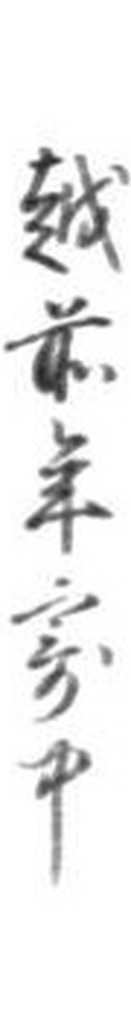越前年寄中
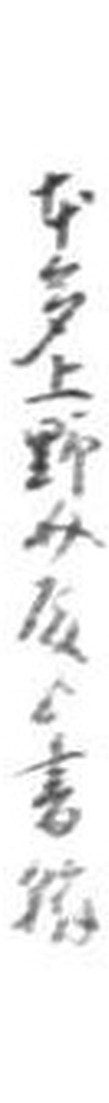本多上野介殿ゟ書翰
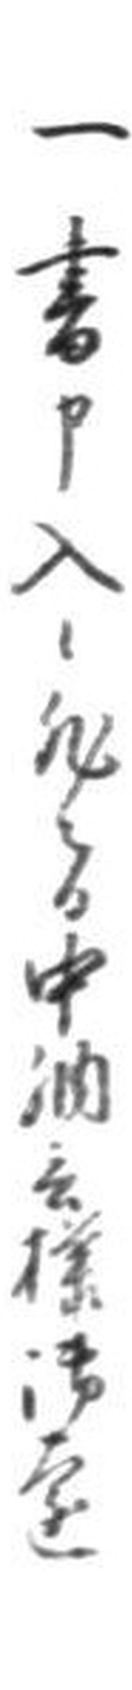一書申入候然者中納言様御遠
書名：家譜 一 秀康公 従天正二年到慶長十二年
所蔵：福井県文書館 Fukui Prefectural Archives
